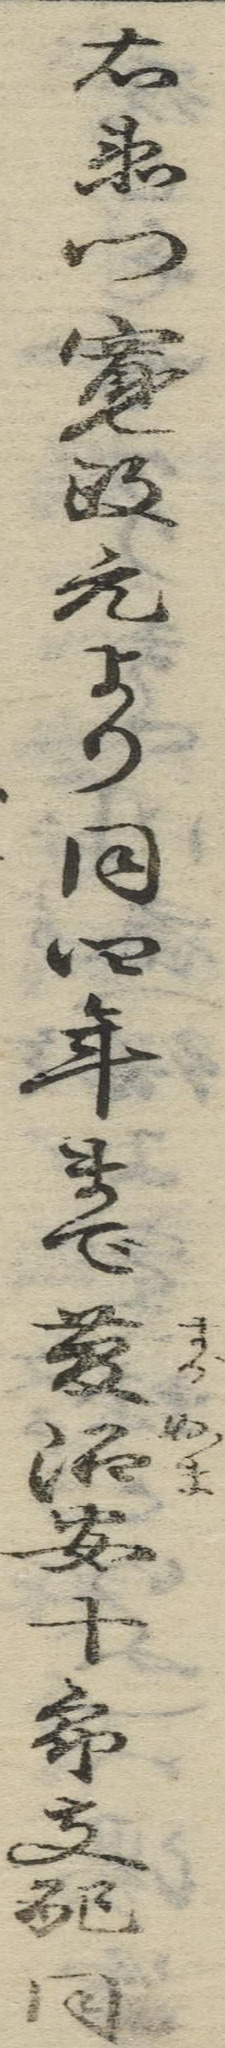右衛門寛政元より同四年まで菅沼安十郎支配同
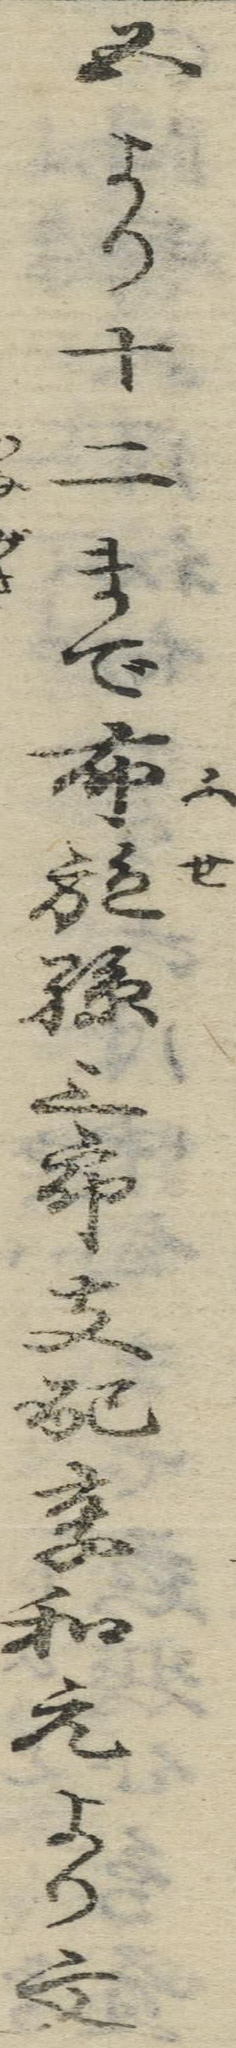五より十二まで布施孫三郎支配享和元より文
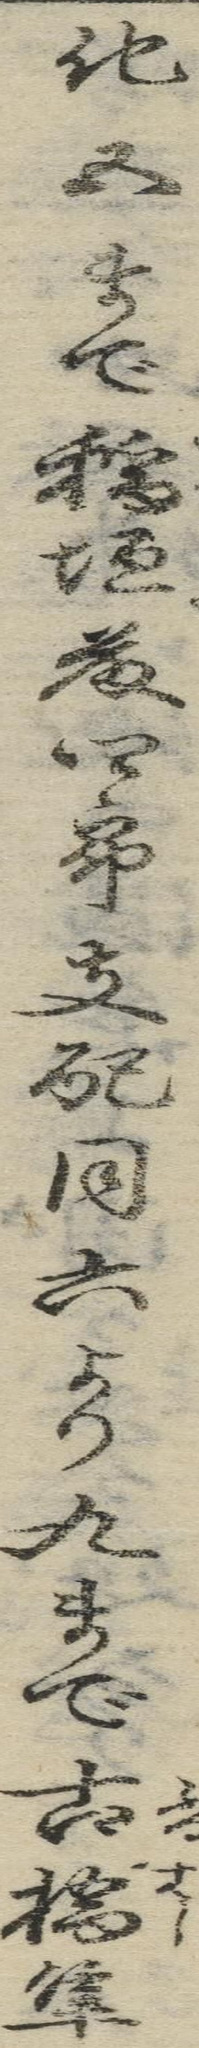化五まで稲垣藤四郎支配同六より九まで古橋隼
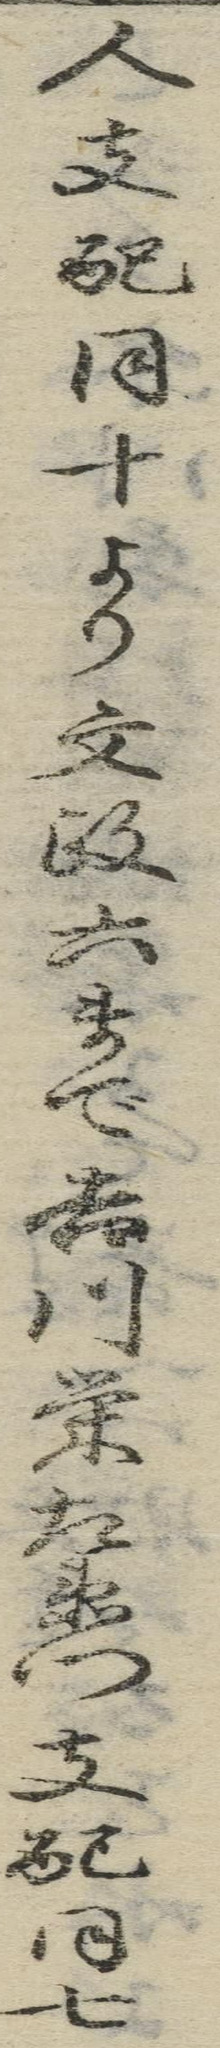人支配同十より文政六まで吉川栄左衛門支配同七
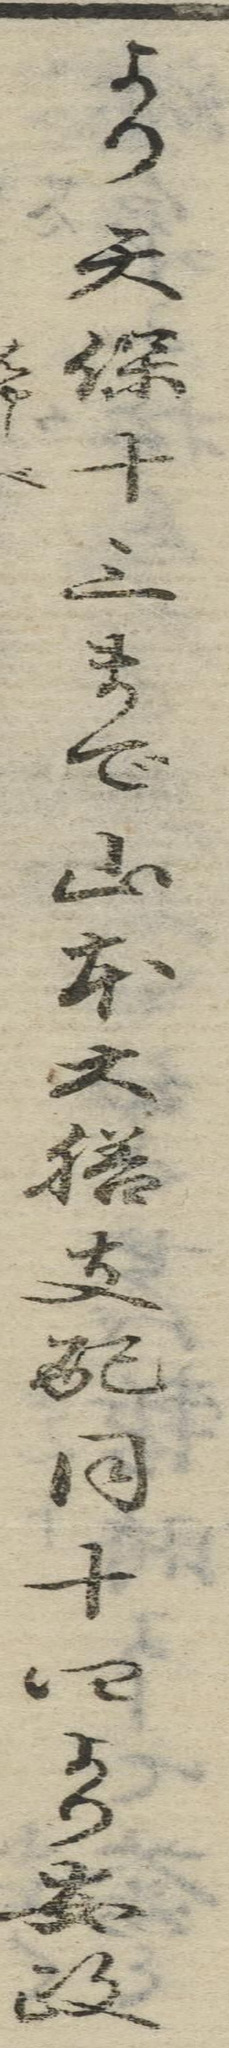より天保十三まで山本大膳支配同十四より安政
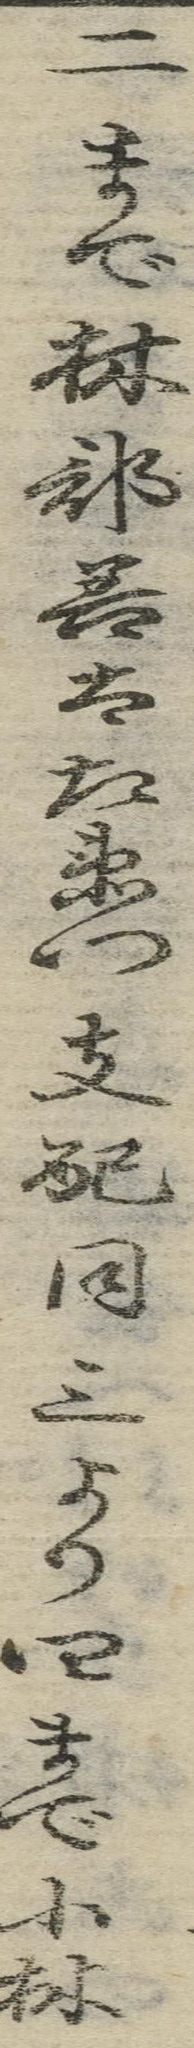二まで林部善太左衛門支配同三より四まで小林
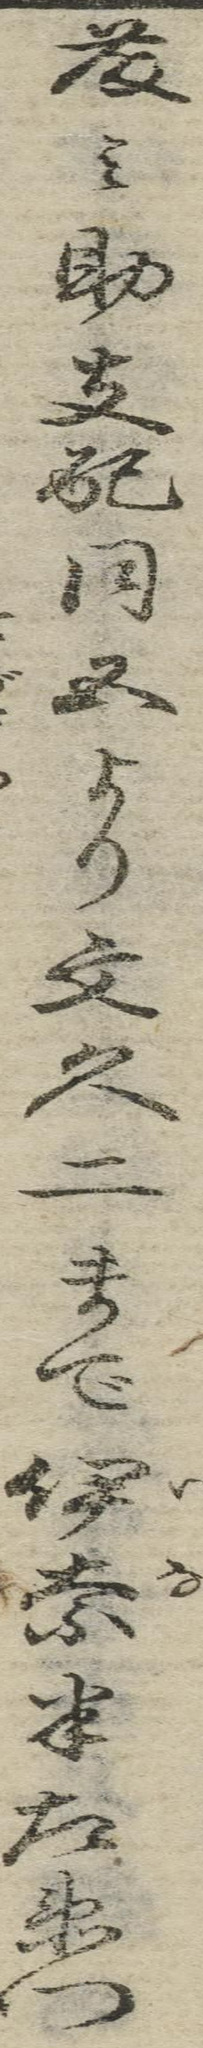藤之助支配支配同五より文久二まで伊奈半左衛門
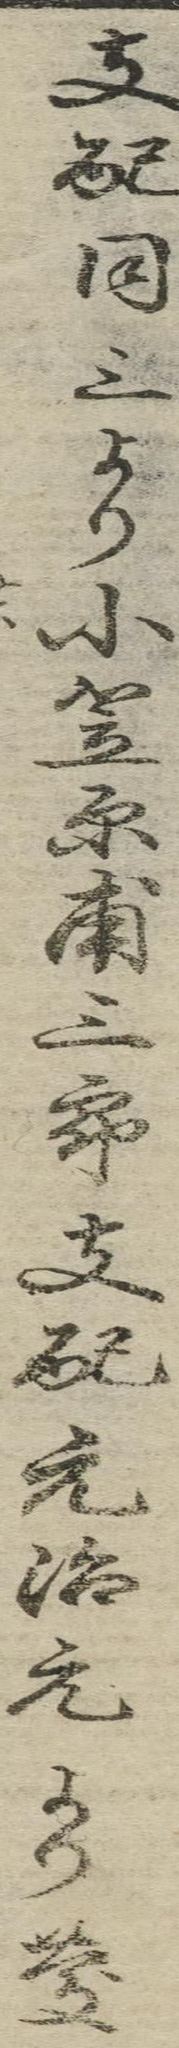支配同三より小笠原甫三郎支配元治元より慶
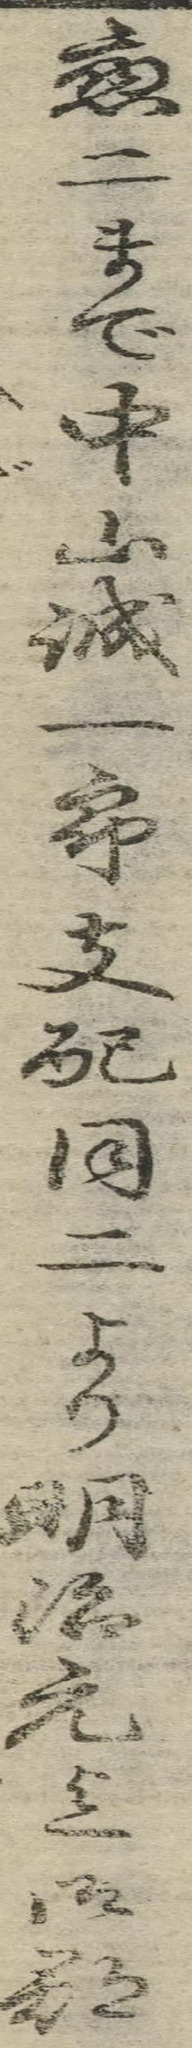應二まで中山誠一郎支配同二より明治元迄御郡
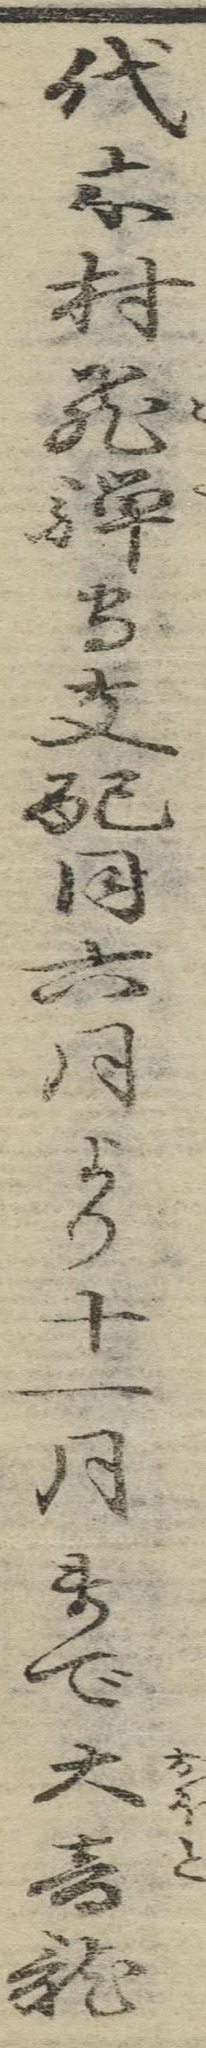代村飛騨守支配同六月より十一月まで大おほど

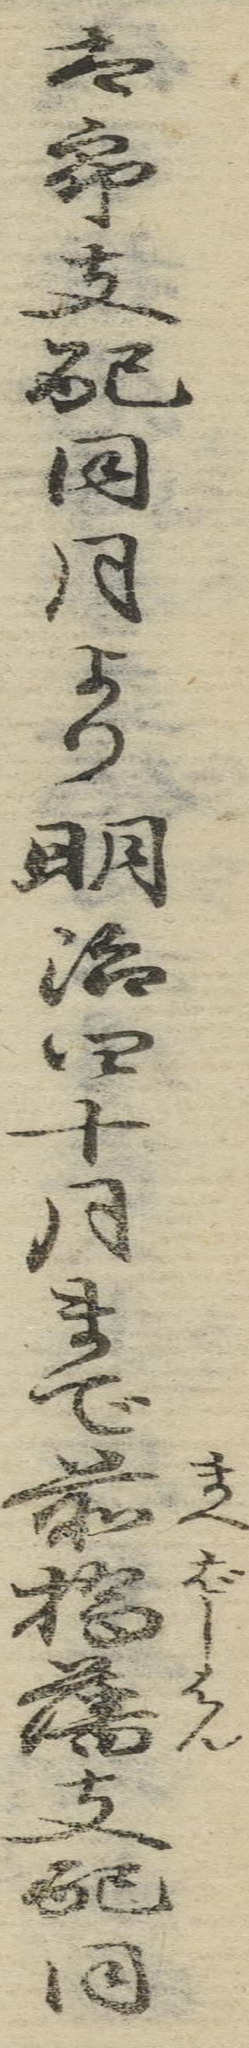太郎支配同月より明治四十月まで前橋藩支配同
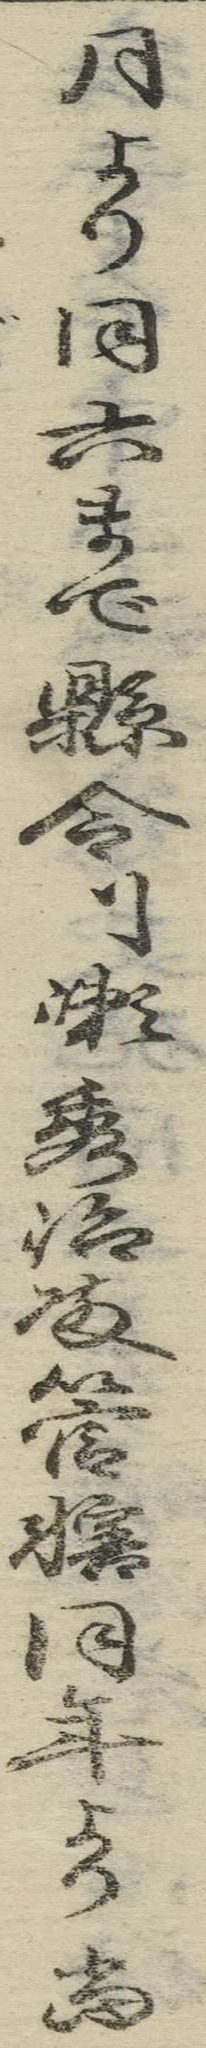月より同六まで縣令川瀬秀治殿管轄同年より当
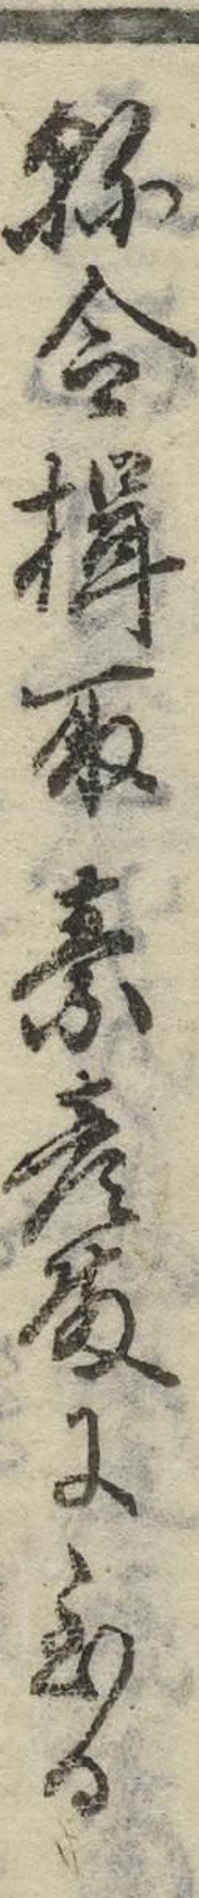縣令楫取素彦殿に至る
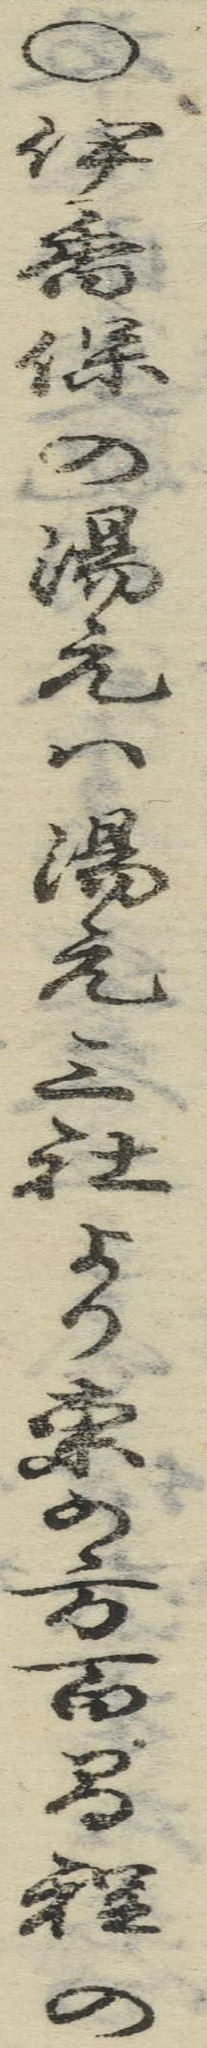○伊香保の湯元は湯元三社より東の方百間程の
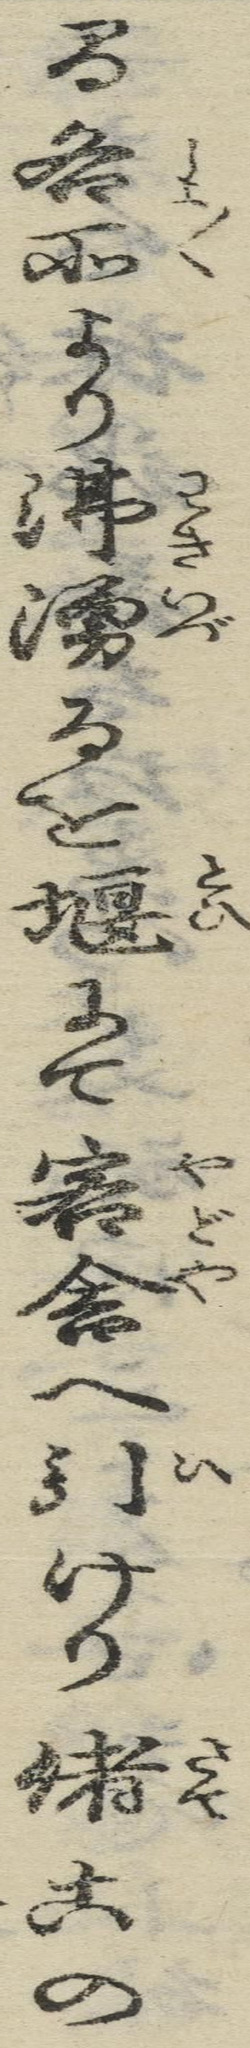間各区暑より沸湧るを堰にて客舎へ引けり偖この
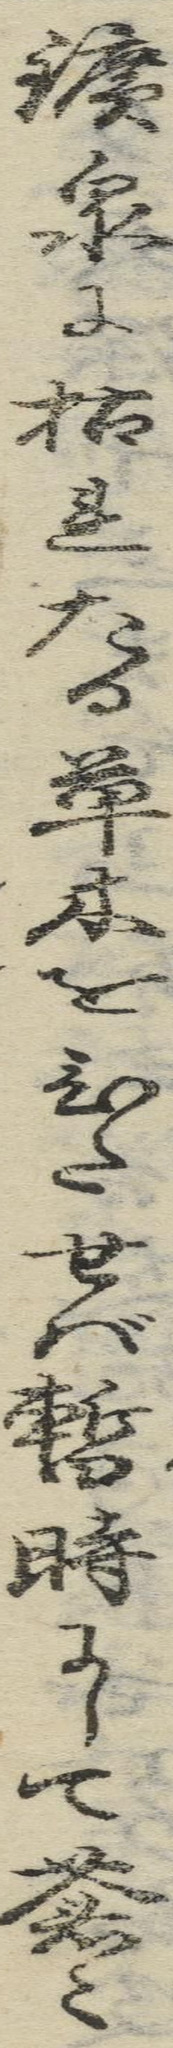鑛泉に枯れたる草木をひたせば暫時にして蒼々
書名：上州伊香保鑛泉圖會　全
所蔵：東京大学地震研究所図書室 Earthquake Research Institute Library, The University of Tokyo, JAPAN
